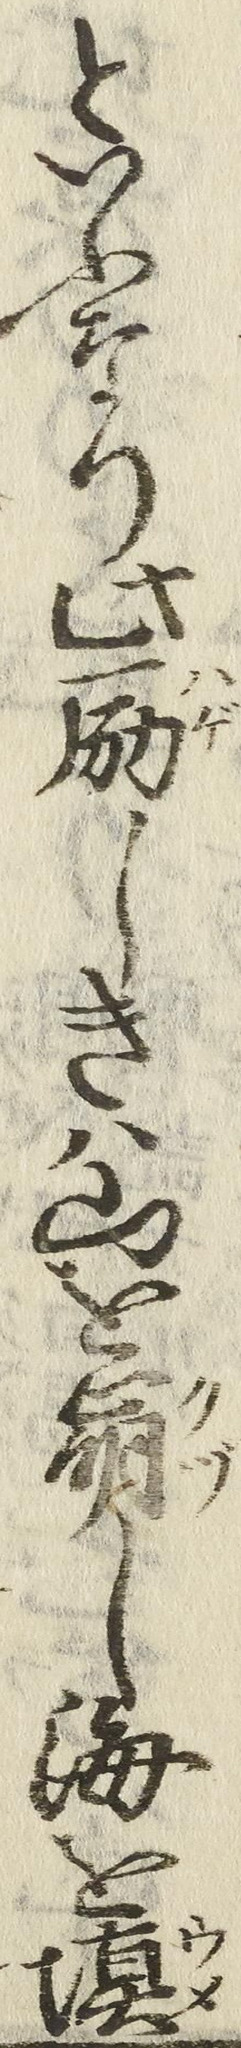といふなり此励しきは山を崩し海を填
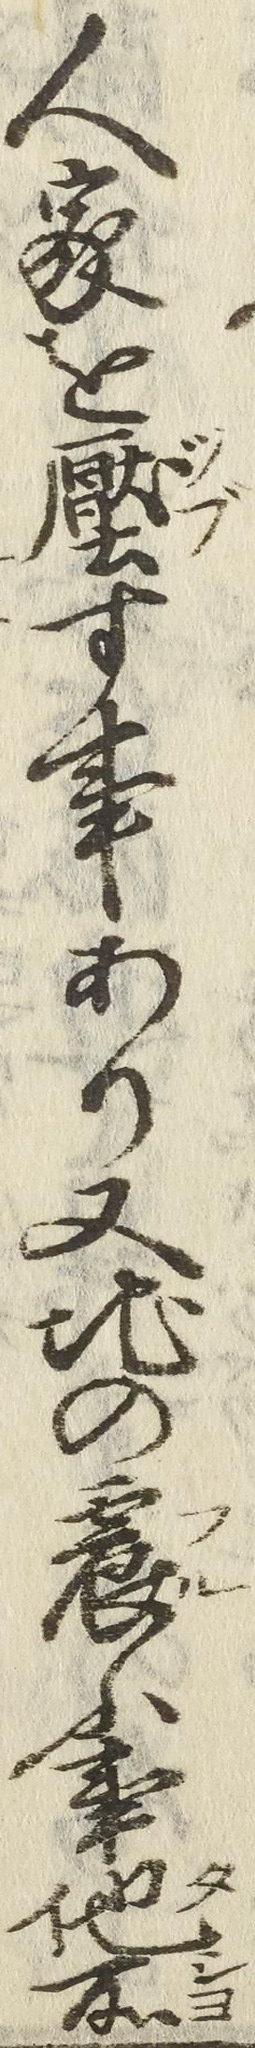人家を圧す事あり又地の震ふ事他所
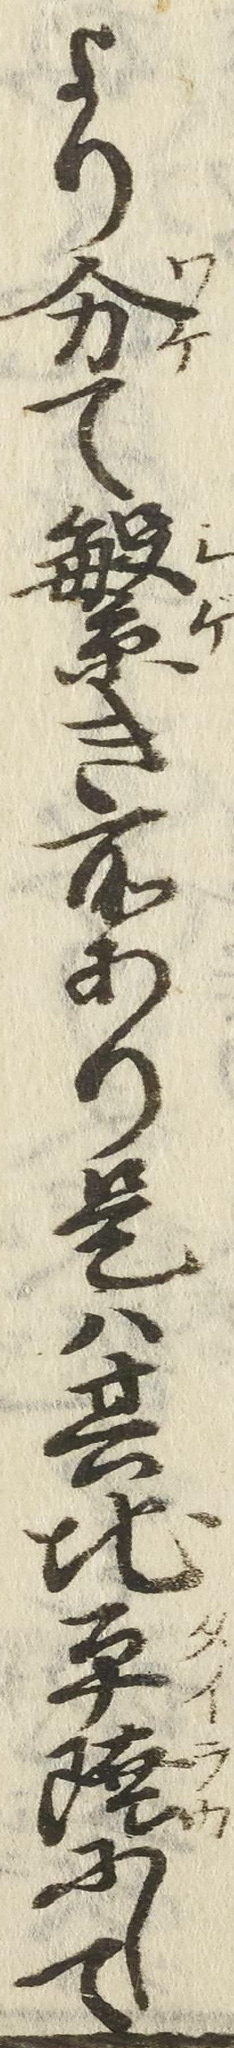より分て繁き所あり是は其地平陸にして
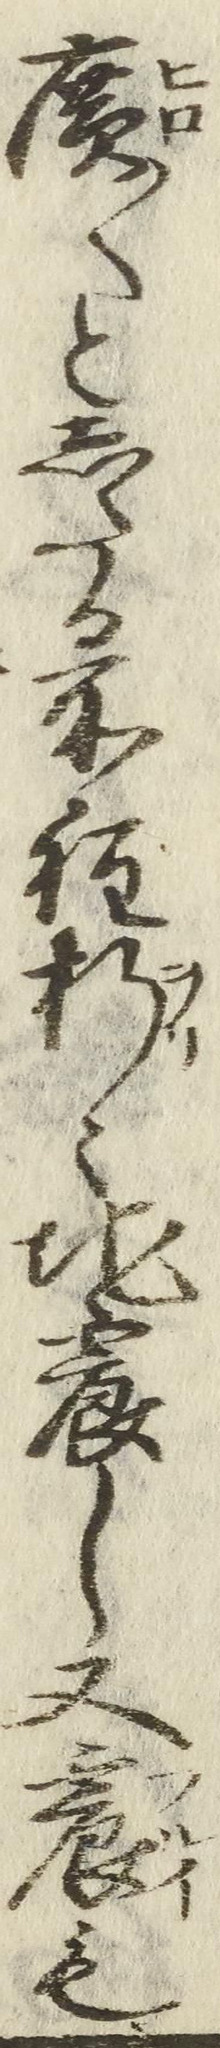広〻としたる所程折〻地震し又震も
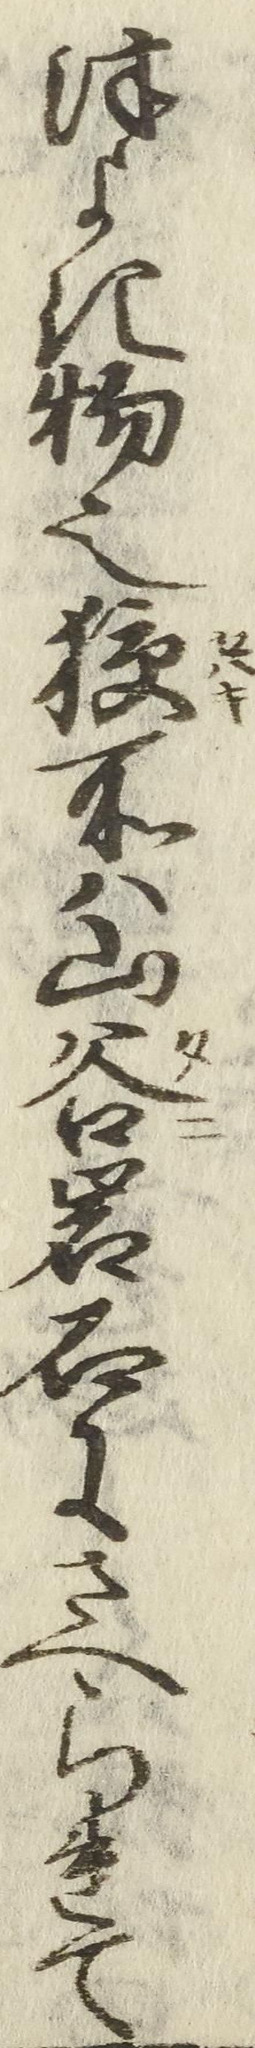つよき物也狭所は山谷岩石にさゝへられて
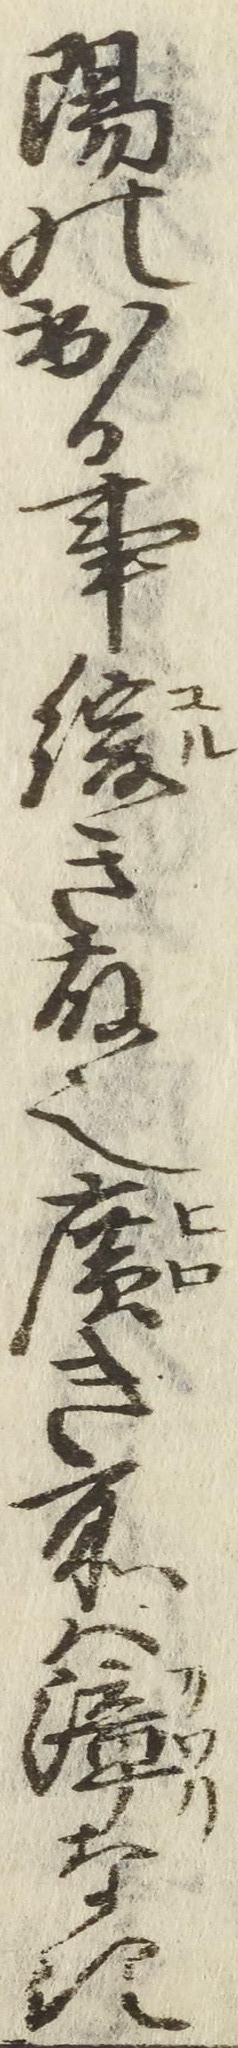陽の出る事緩き故也広き所は障なき
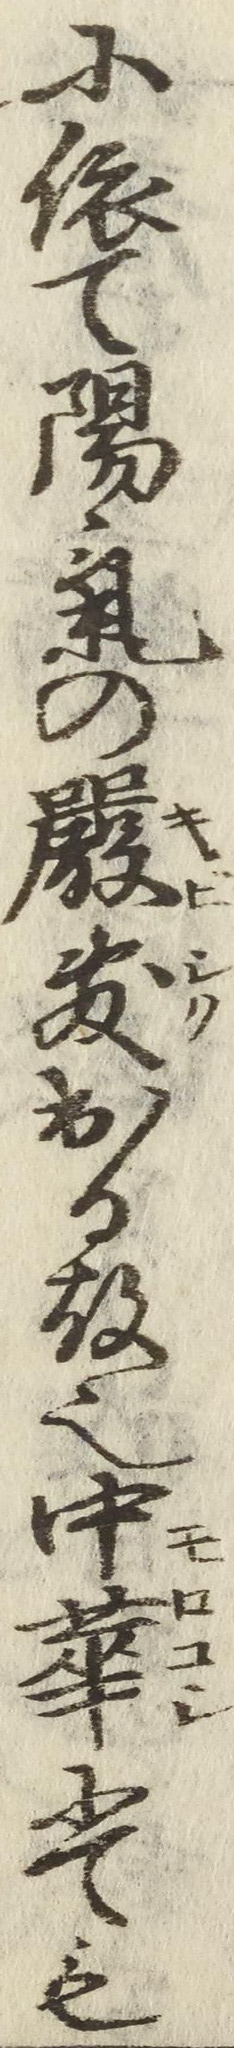に依て陽気の厳敷出る故也中華にても
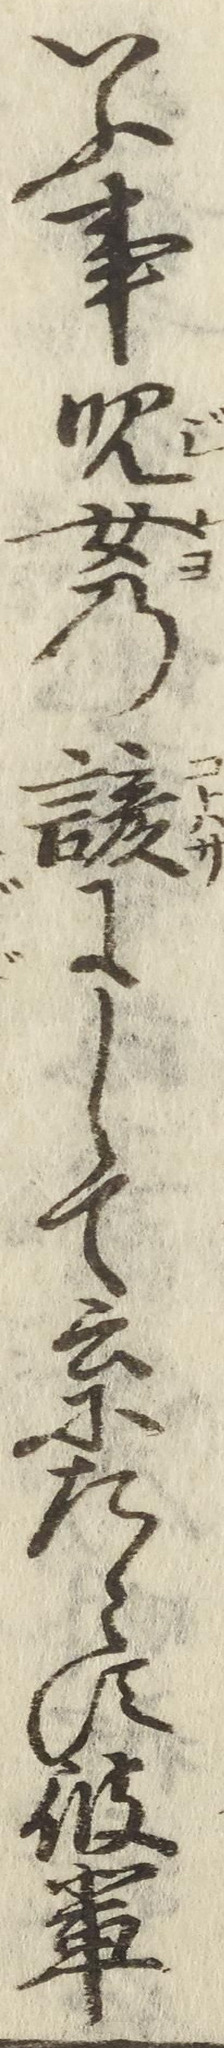いふ事児女の諺にして云にたらす彼輩
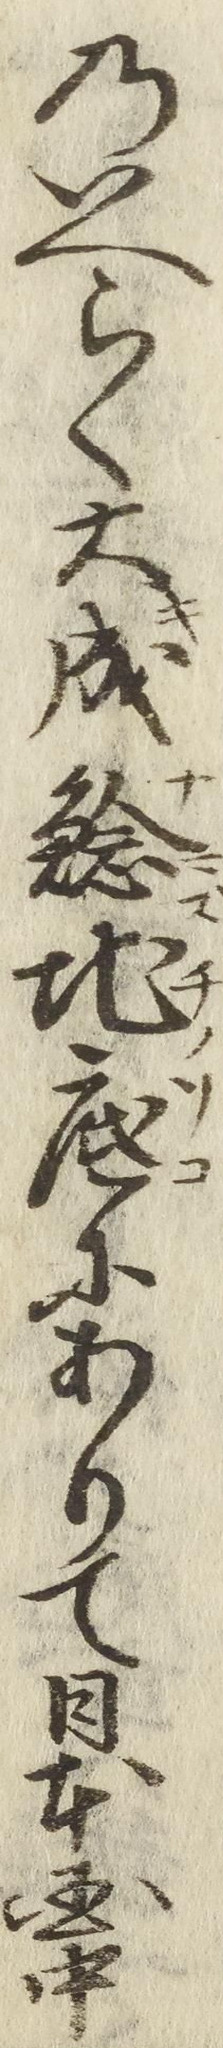のいへらく大キ成鯰地底にありて日本国中

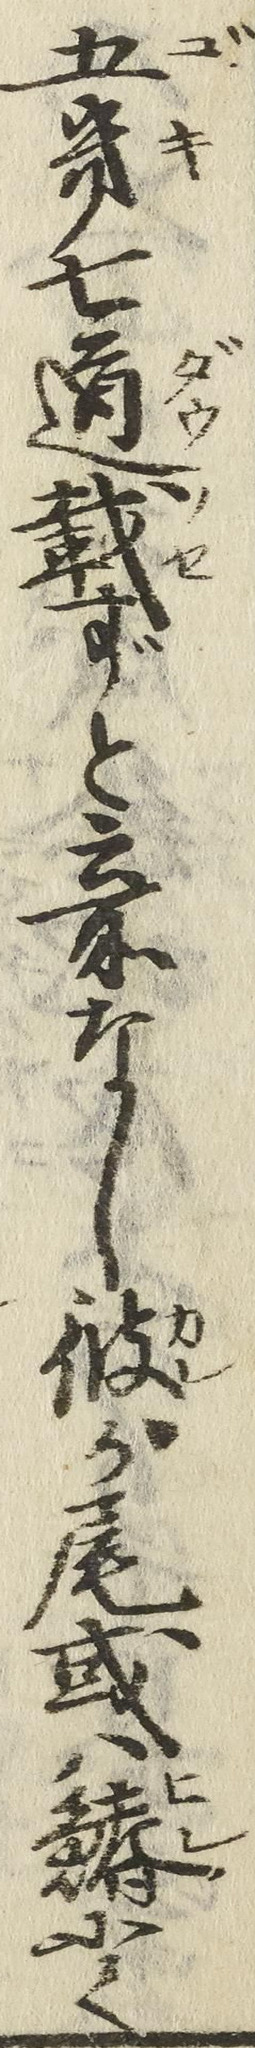五畿七道載ずと云所なし彼が尾或は鰭にて
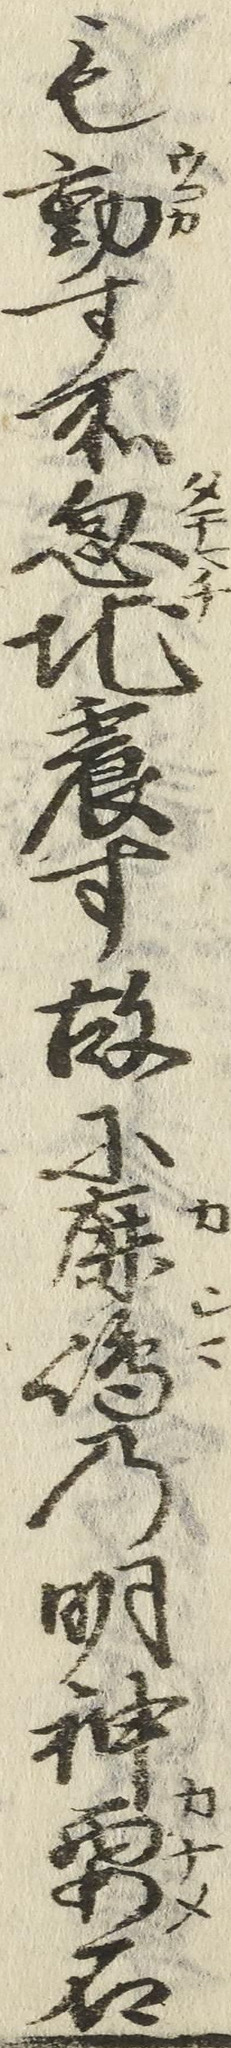も動す所忽地震す故に鹿嶋の明神要石
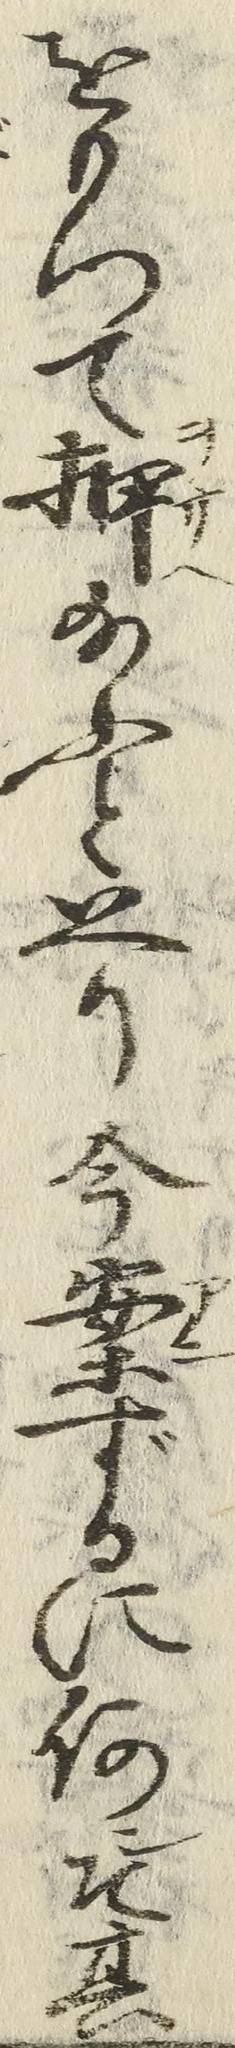をもつて押給ふといへり今案ずるに何ンそ其
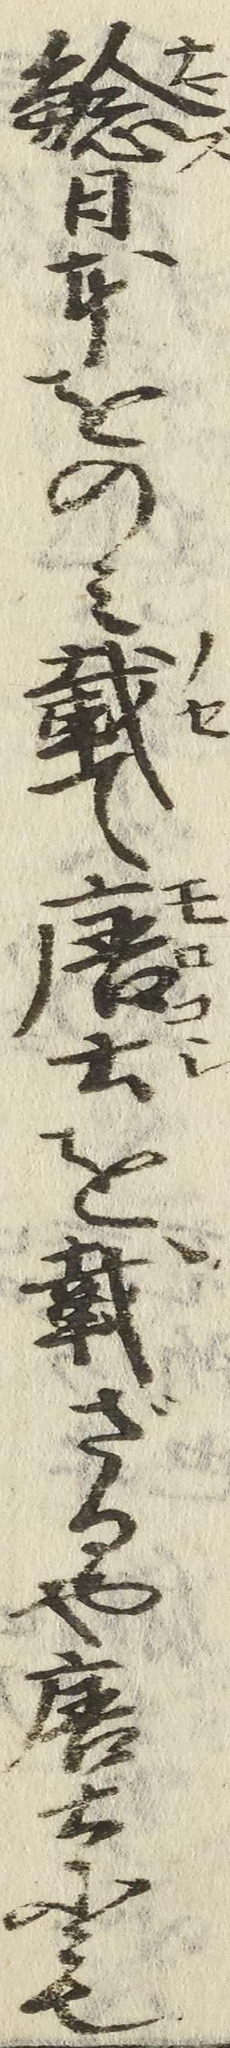鯰日本をのみ載て唐土を載ざるや唐土にも
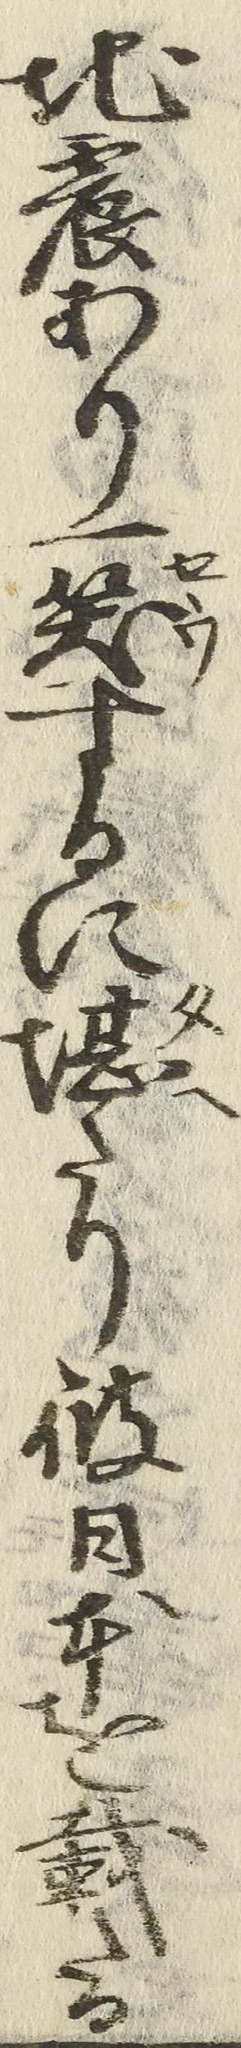地震あり一笑するに堪たり彼日本を載たる
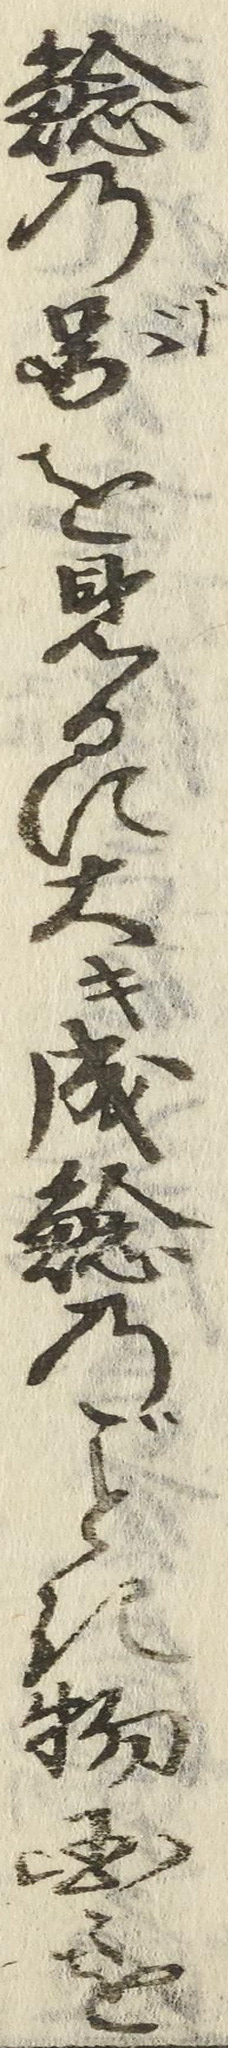鯰の図を見るに大キ成鯰のごとき物国〻を
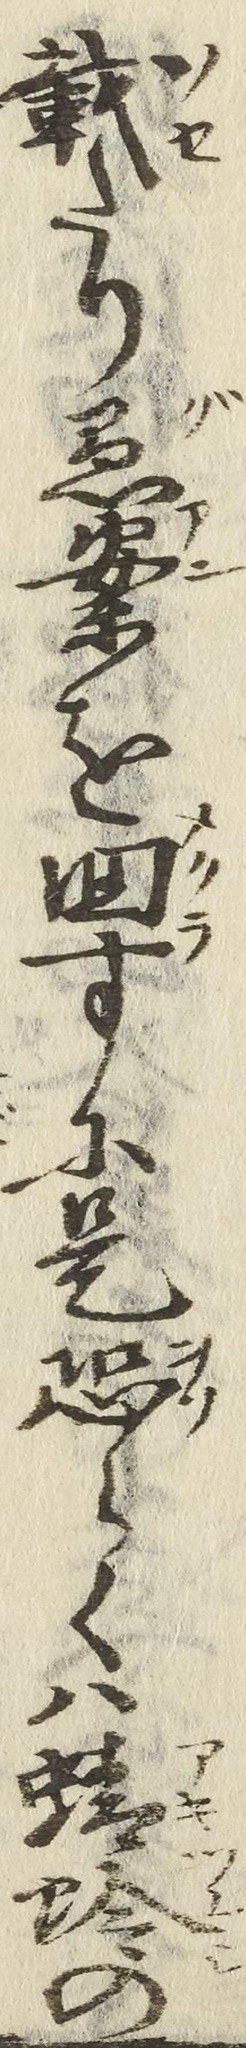載たり愚案を回すに是恐らくは蜻蛉の
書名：天地或問珍　天
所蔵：東京大学地震研究所図書室 Earthquake Research Institute Library, The University of Tokyo, JAPAN
